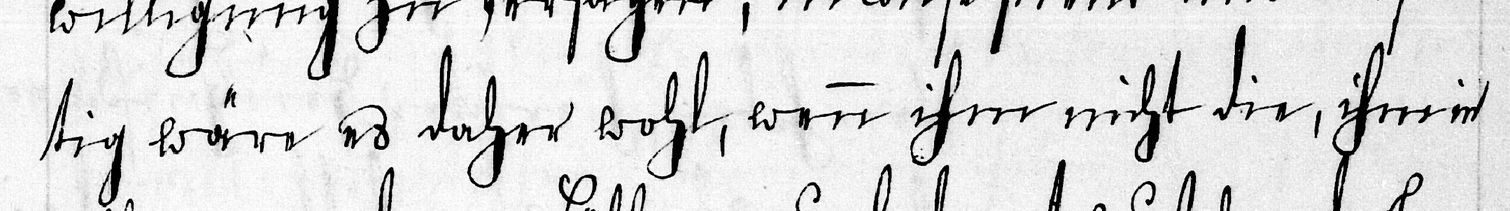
tig wäre es daher wohl, wenn ihm nicht die, ihm in
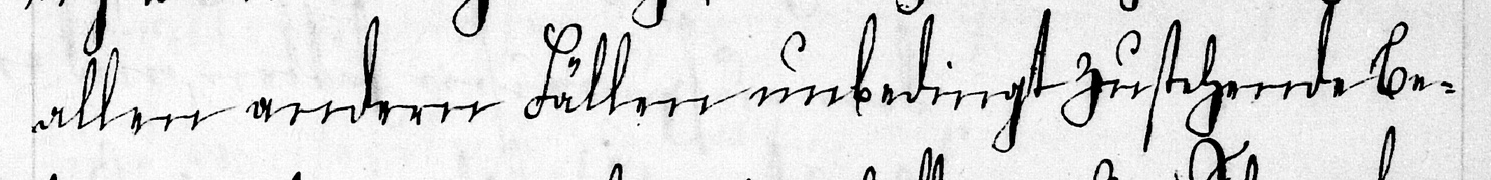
allen andern Fällen unbedingt zustehende Be¬
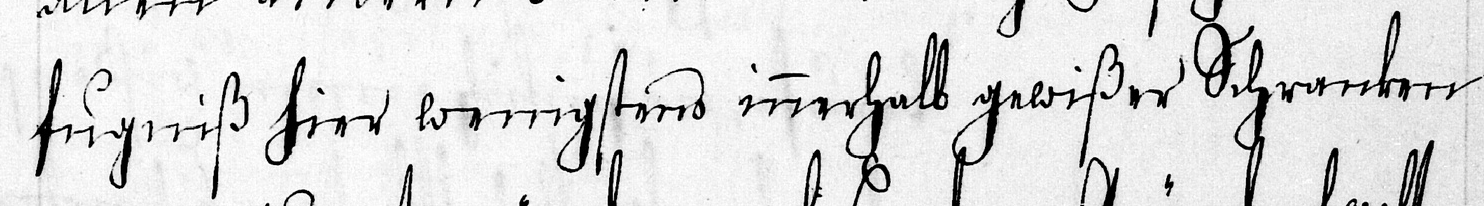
fugniß hier wenigstens innerhalb gewißer Schranken
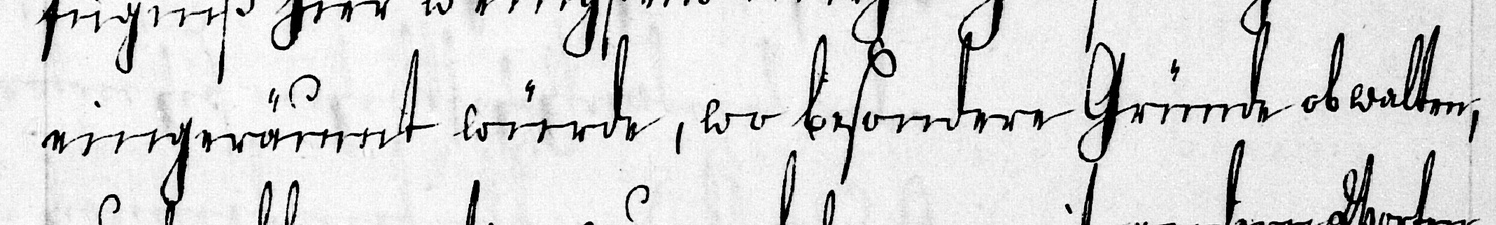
eingeräumt würde, wo besondere Gründe obwalten,
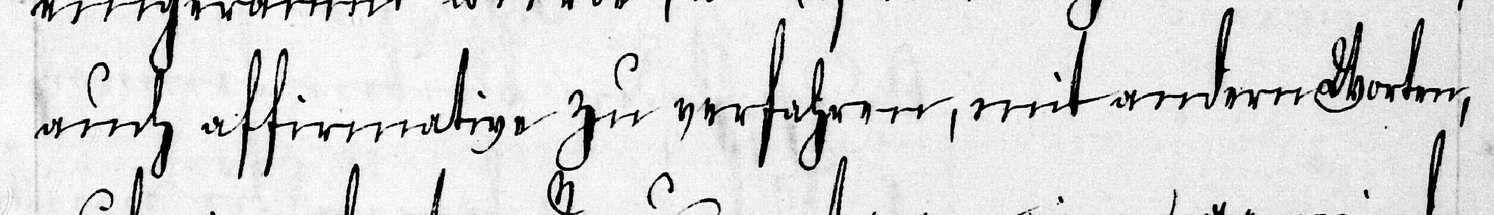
auch affirmative zu verfahren, mit andern Worten,
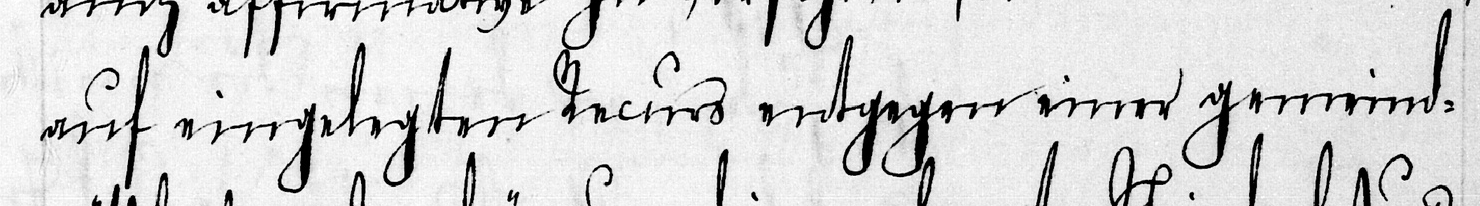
auf eingelegten Recurs entgegen einer gemeind¬
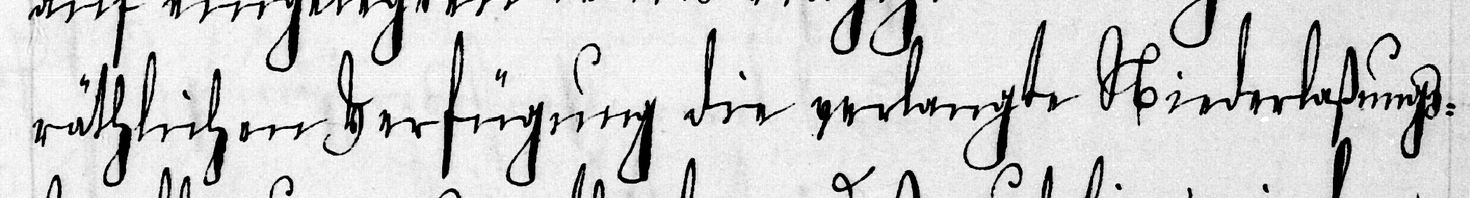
räthlichen Verfügung die verlangte Niederlaßungs¬
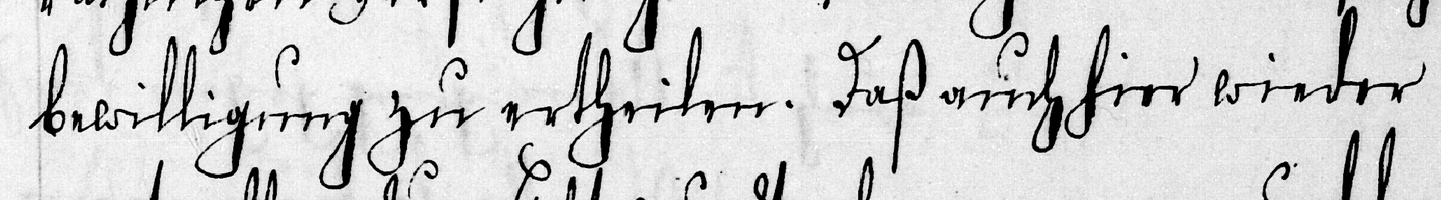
bewilligung zu ertheilen. Daß auch hier wieder
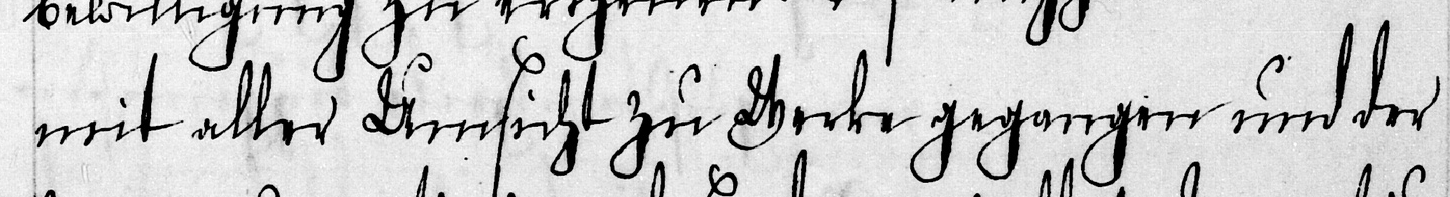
mit aller Umsicht zu Werke gegangen und der
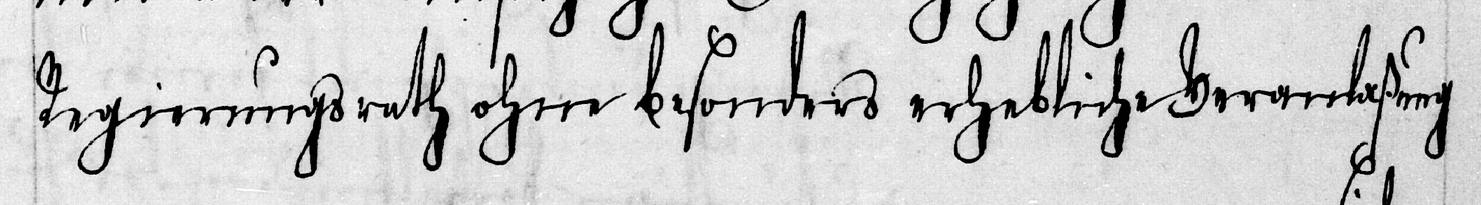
Regierungsrath ohne besonders erhebliche Veranlaßung
